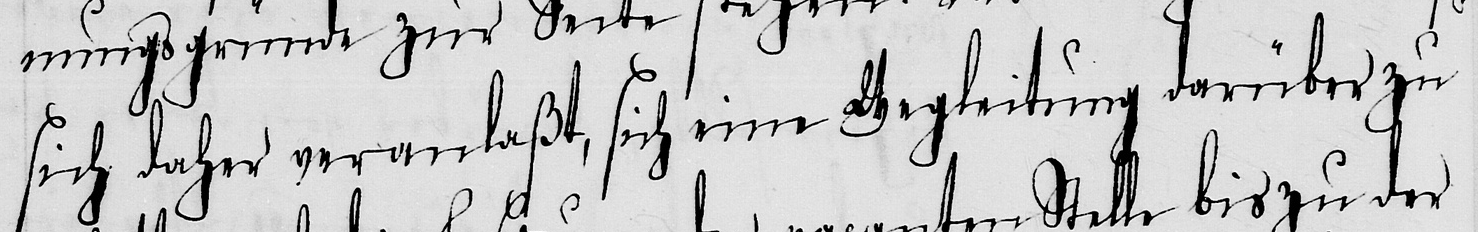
sich daher veranlaßt, sich eine Wegleitung darüber zu
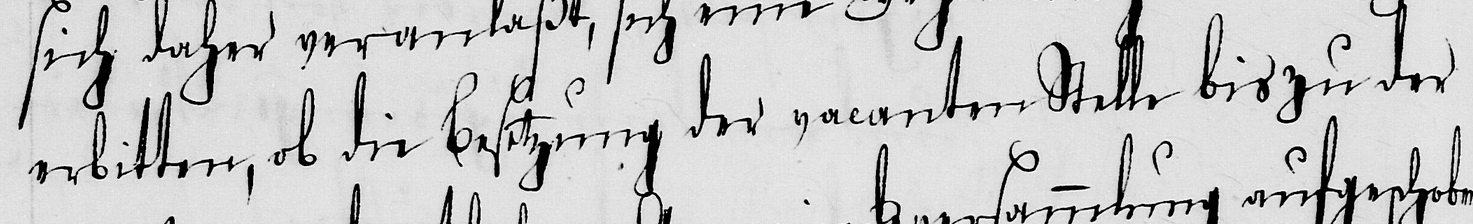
erbitten, ob die Besetzung der vacanten Stelle bis zu der
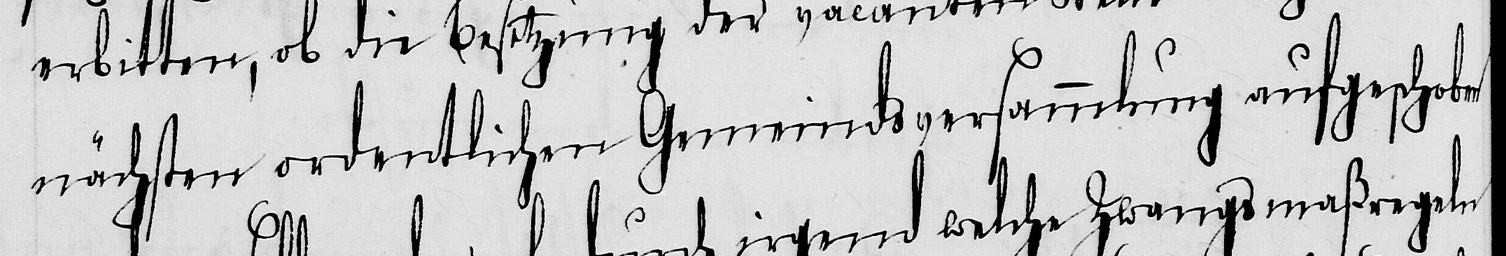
nächsten ordentlichen Gemeindsversammlung aufgeschoben
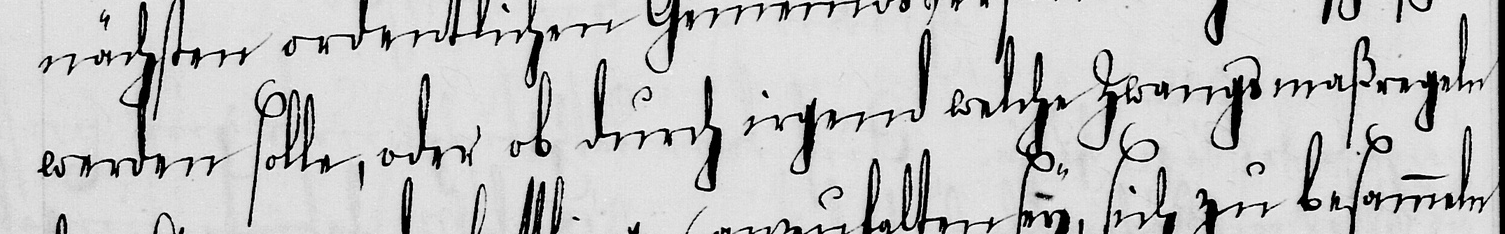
werden solle, oder ob durch irgend welche Zwangsmaßregeln
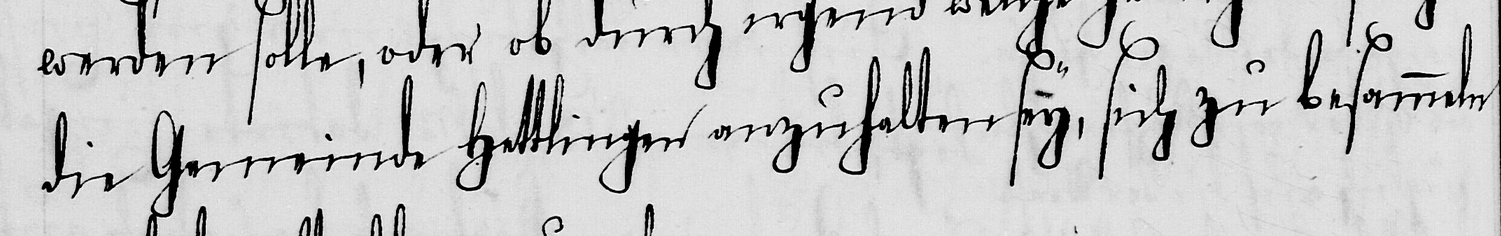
die Gemeinde Hettlingen anzuhalten sey, sich zu besamme¬
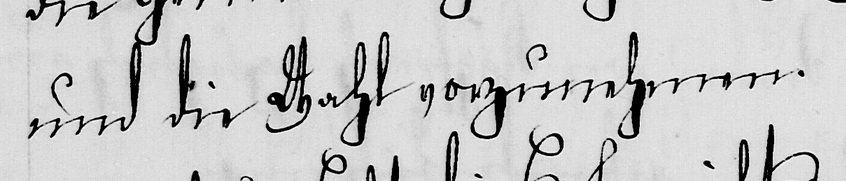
und die Wahl vorzunehmen.
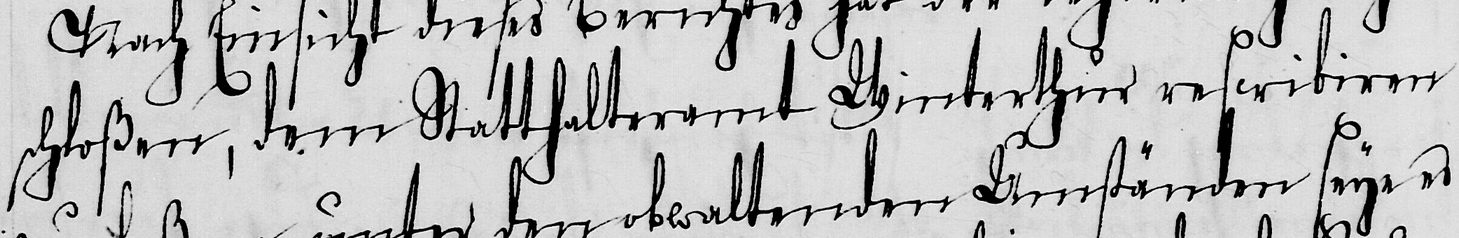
schloßen, dem Statthalteramt Winterthur rescribiren
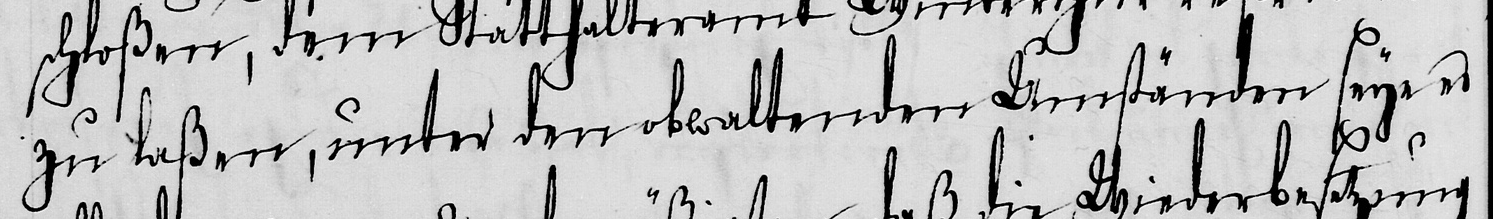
zu laßen, unter den obwaltenden Umständen seye es
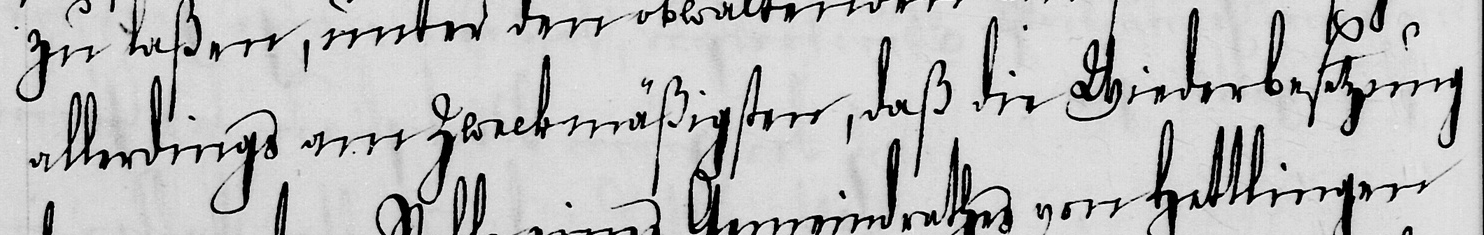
allerdings am Zweckmäßigsten, daß die Wiederbesetzung
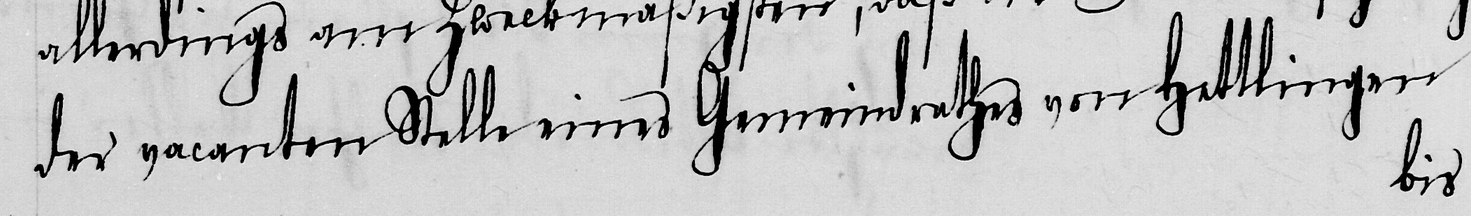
der vacanten Stelle eines Gemeindrathes von Hettlingen
